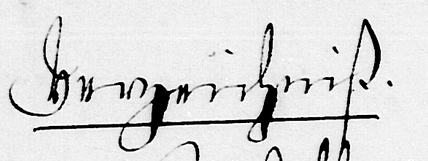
Verzeichniß.
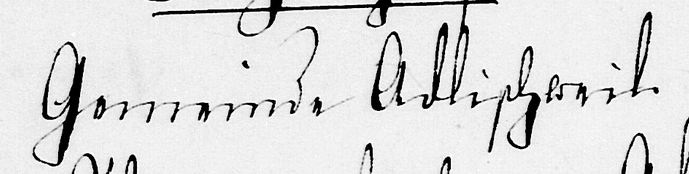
Gemeinde Adlischweil.
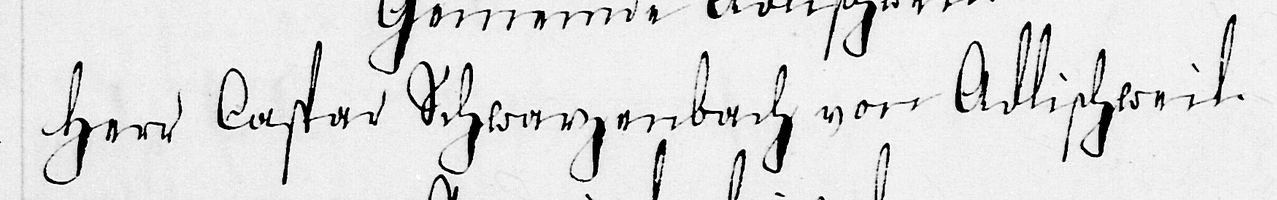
Herr Caspar Schwarzenbach von Adlischweil.
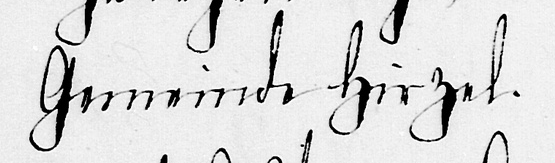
Gemeinde Hirzel.
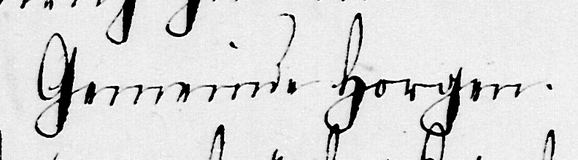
Gemeinde Horgen.
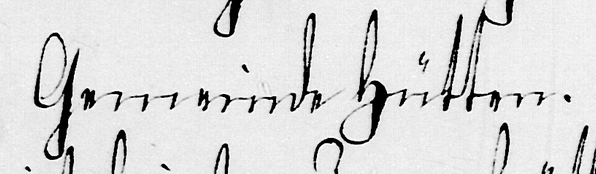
Gemeinde Hütten.
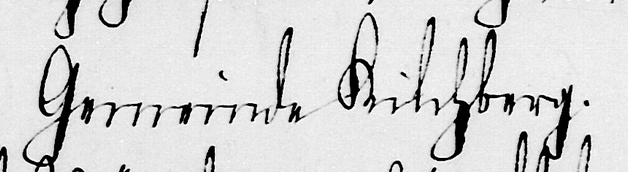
Gemeinde Kilchberg.
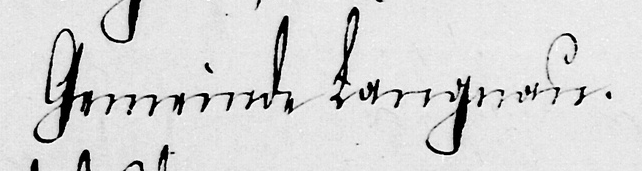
Gemeinde Langnau.
